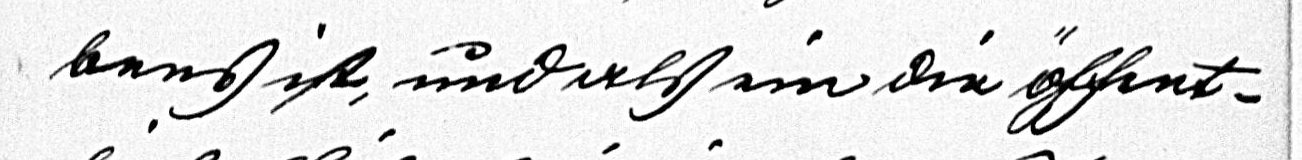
bens ist, und als ein die öffent¬
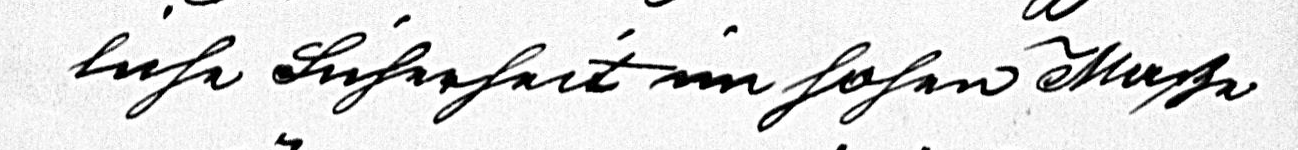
liche Sicherheit im hohen Maße
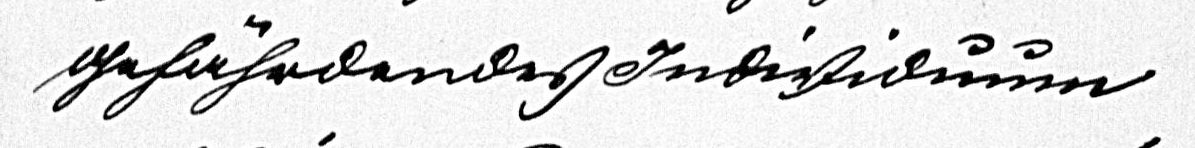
gefährdendes Individuum
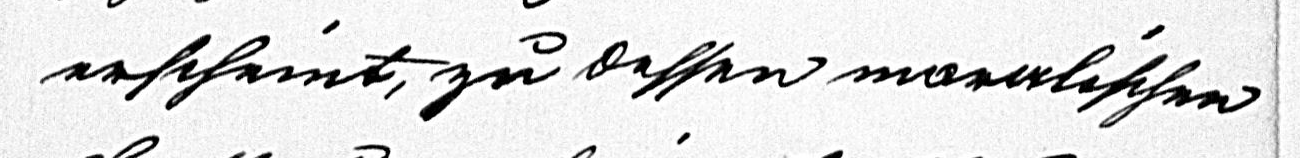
erscheint, zu dessen moralischer
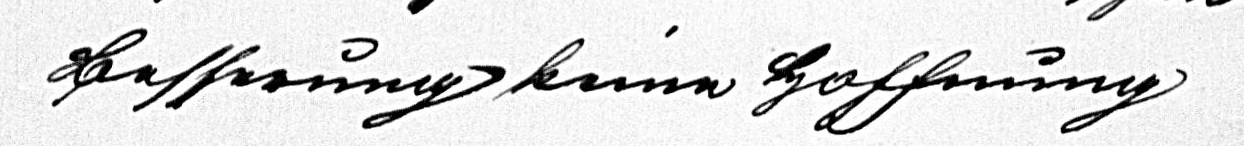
Besserung keine Hoffnung
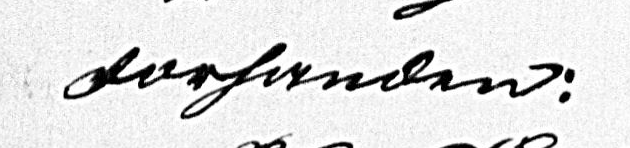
vorhanden:
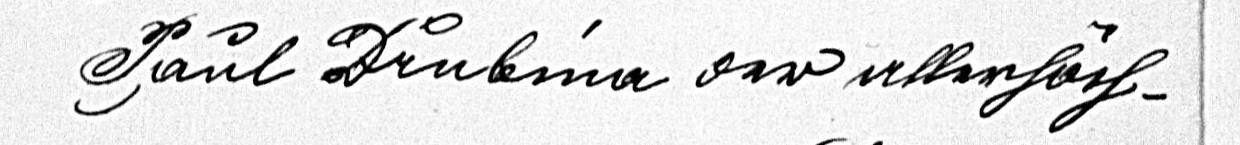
Paul Drubina der allerhöch¬
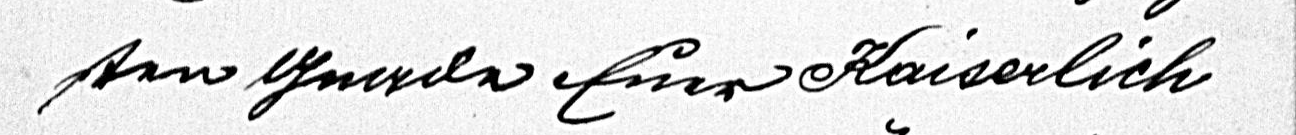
sten Gnade Euer Kaiserlich
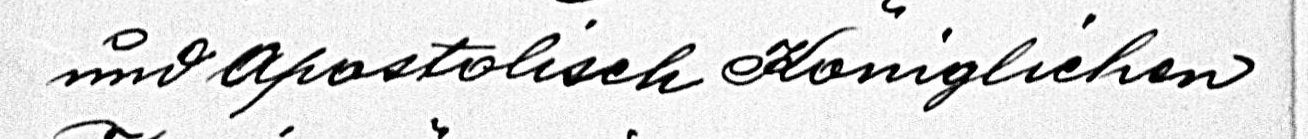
und Apostolisch Königlichen
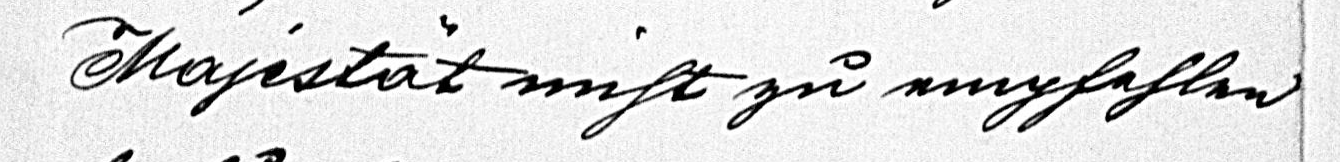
Majestät nicht zu empfehlen
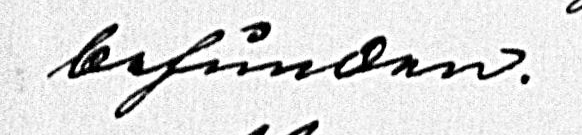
befunden.
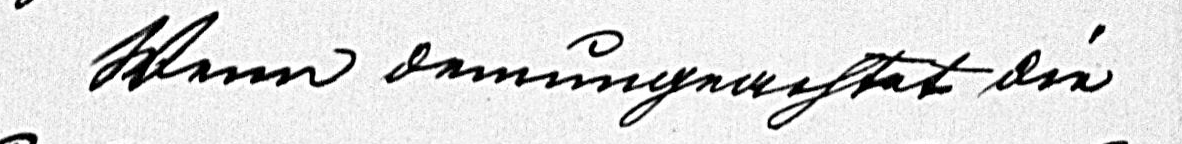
Wenn demungeachtet die
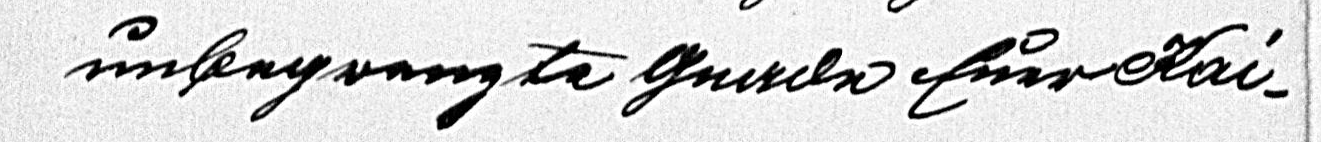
unbegrenzte Gnade Euer Kai¬
